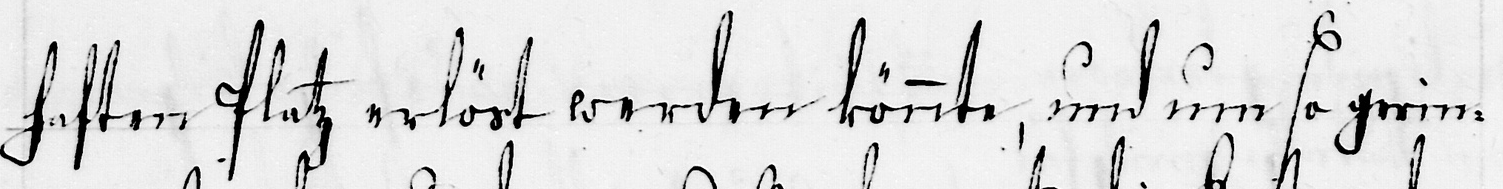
haften Platz erlöst werden könnte, und um so gerin¬
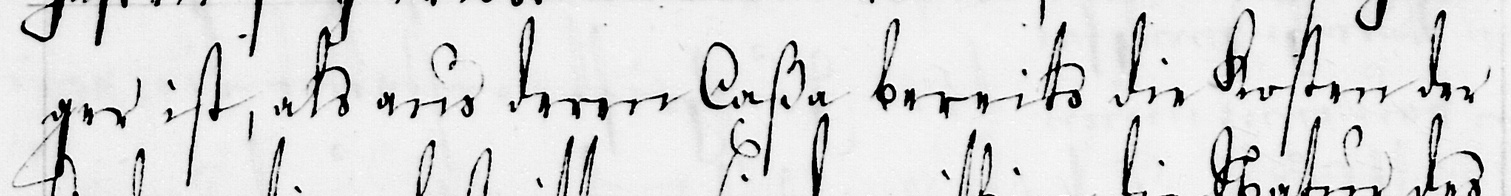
ger ist, als aus deren Caßa bereits die Kosten der
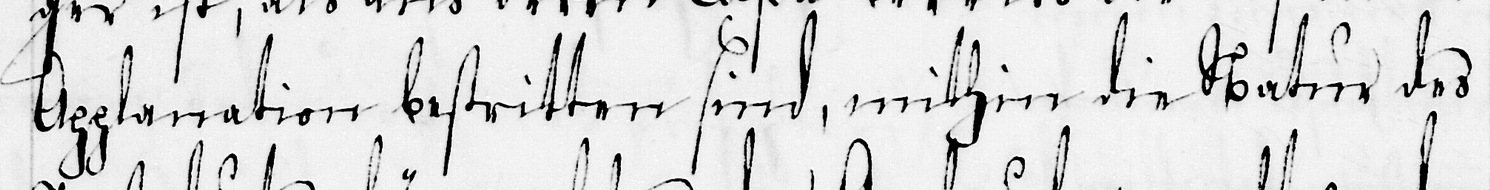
Applanation bestritten sind, mithin die Natur des
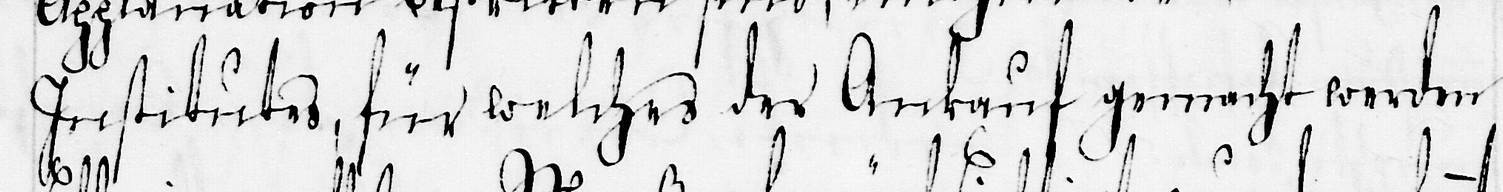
Institutes, für welches der Ankauf gemacht werden
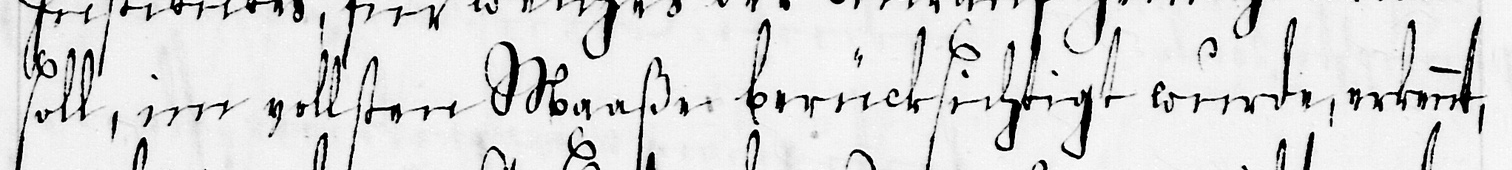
soll, im vollsten Maaße berücksichtigt wurde, erkennt,
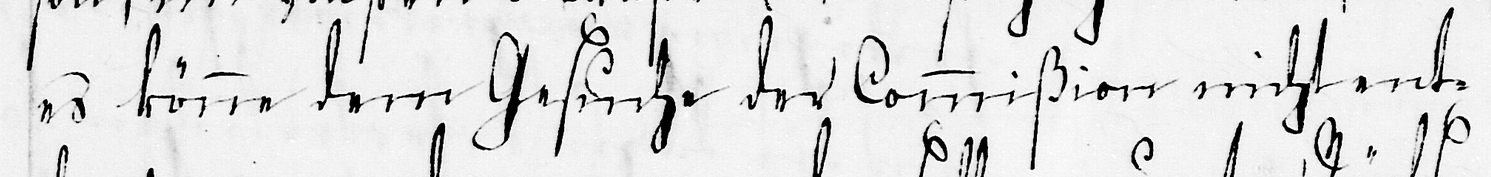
es könne dem Gesuche der Commißion nicht ent¬
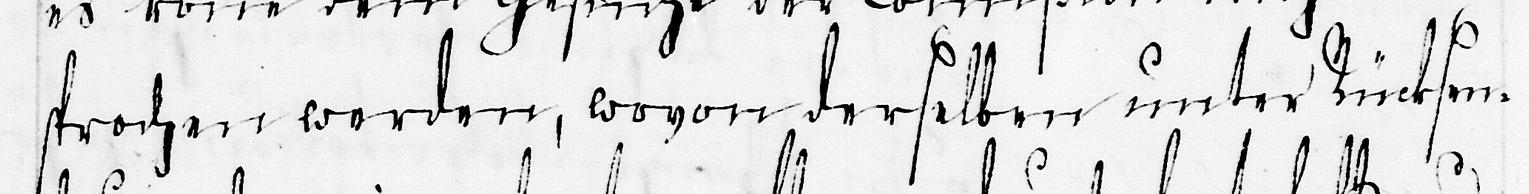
sprochen werden, wovon derselben unter Rücksen¬
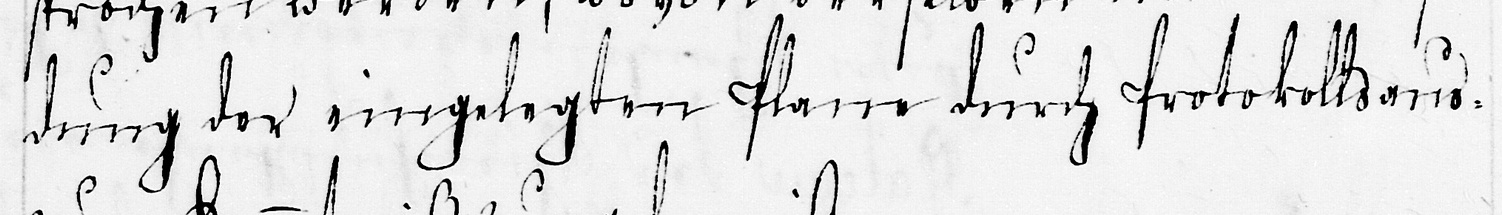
dung der eingelegten Plane durch Protokollsaus¬
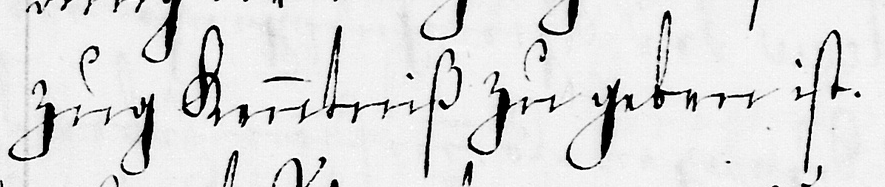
zug Kenntniß zu geben ist.
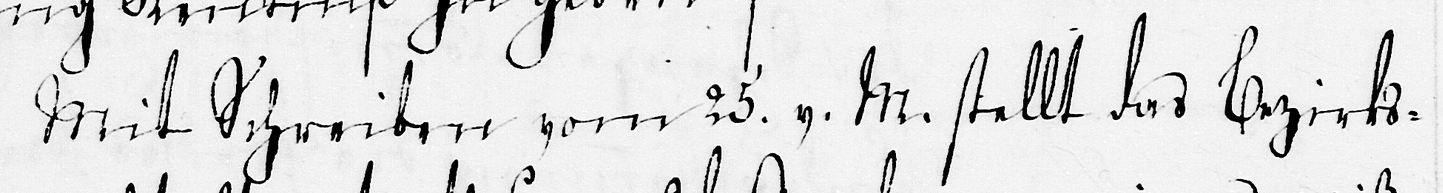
Mit Schreiben vom 25. v. M. stellt das Bezirks¬
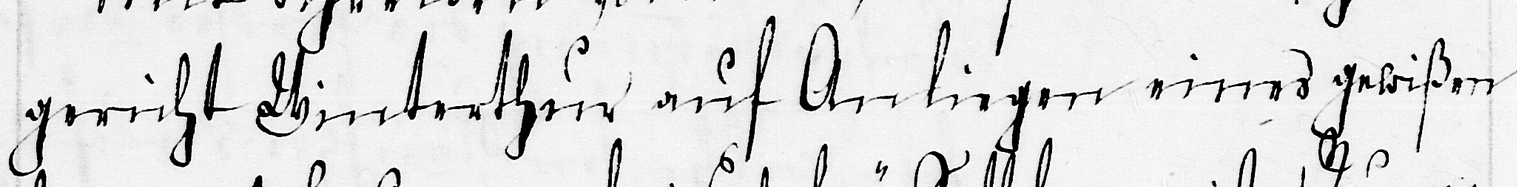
gericht Winterthur auf Anliegen eines gewißen
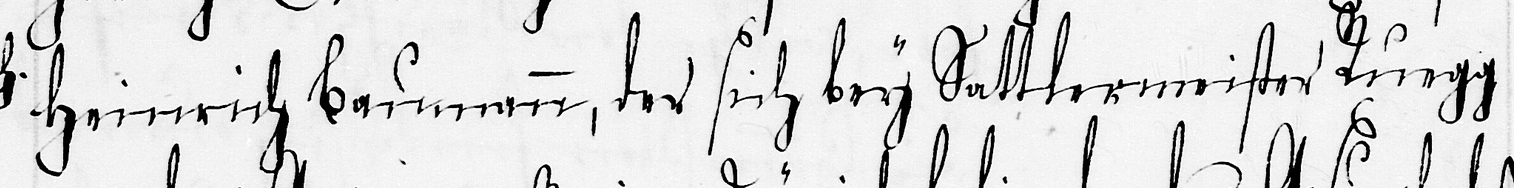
Heinrich Baumann, der sich bey Sattlermeister Ruegg
